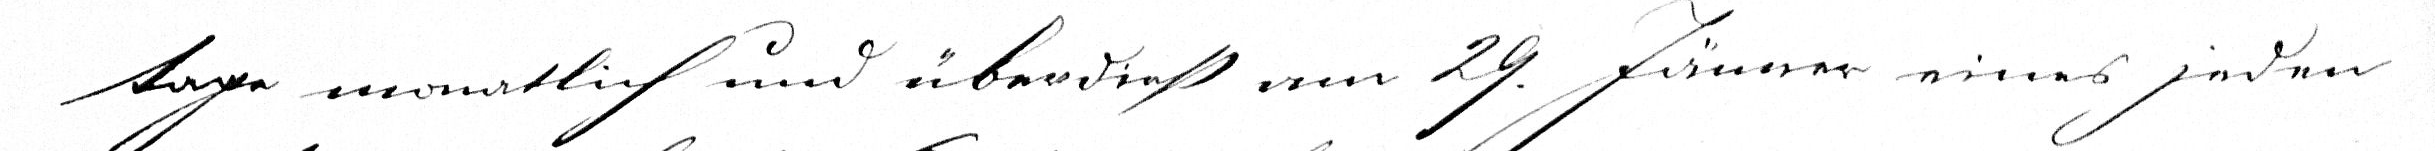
tage monatlich und überdieß am 29. Jänner eines jeden
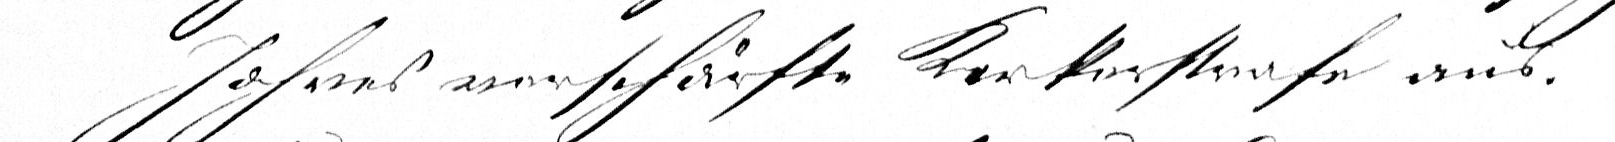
Jahres verschärfte Kerkerstrafe aus.
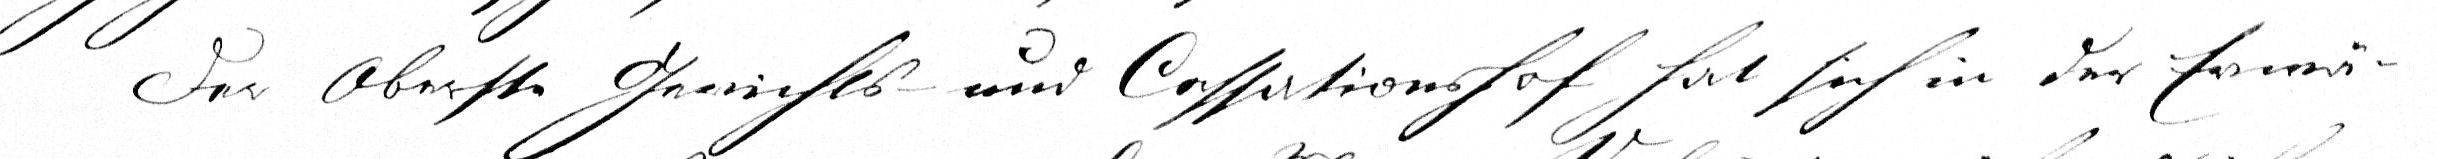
Der Oberste Gerichts und Cassationshof hat sich in der Erwä¬
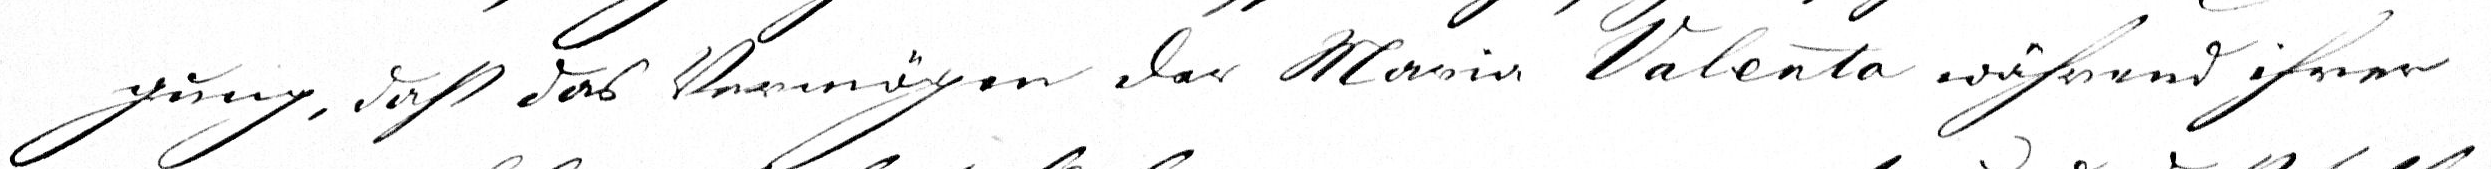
gung, daß das Vermögen der Maria Valenta während ihrer
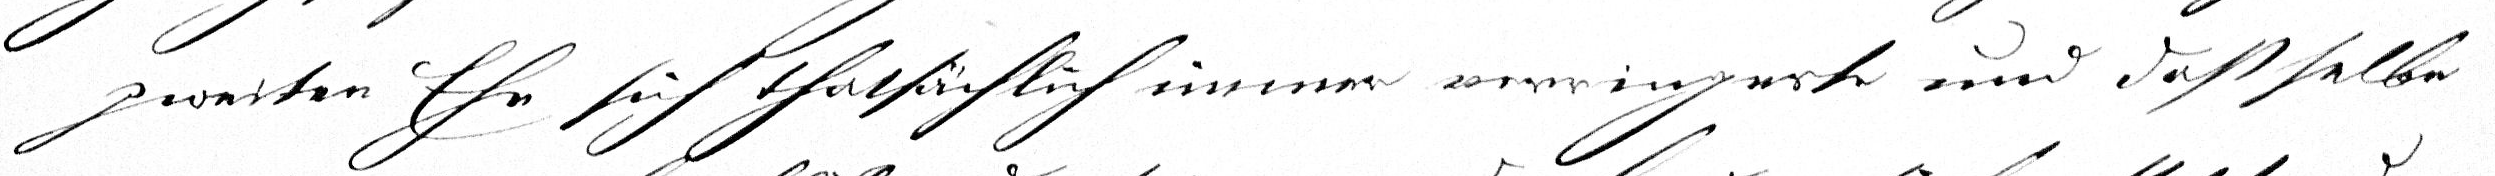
zweiten Ehr sich thatsächlich immer verringerte und daß selbe
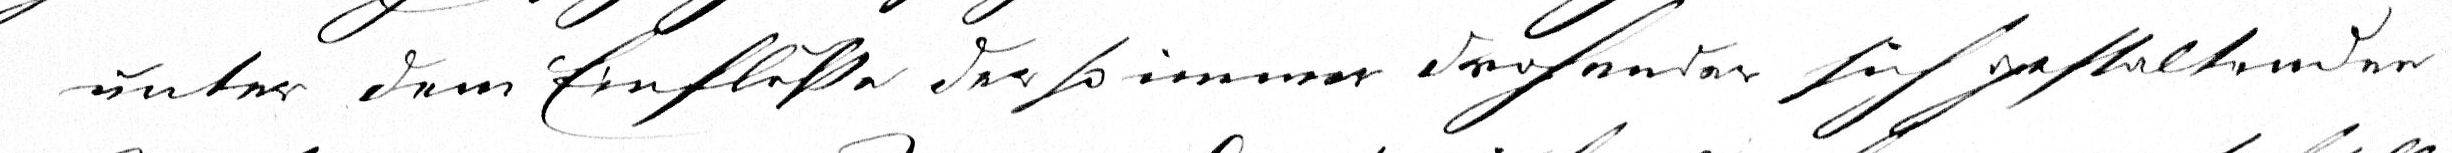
unter dem Einfluße der so immer drohender sich gestaltenden
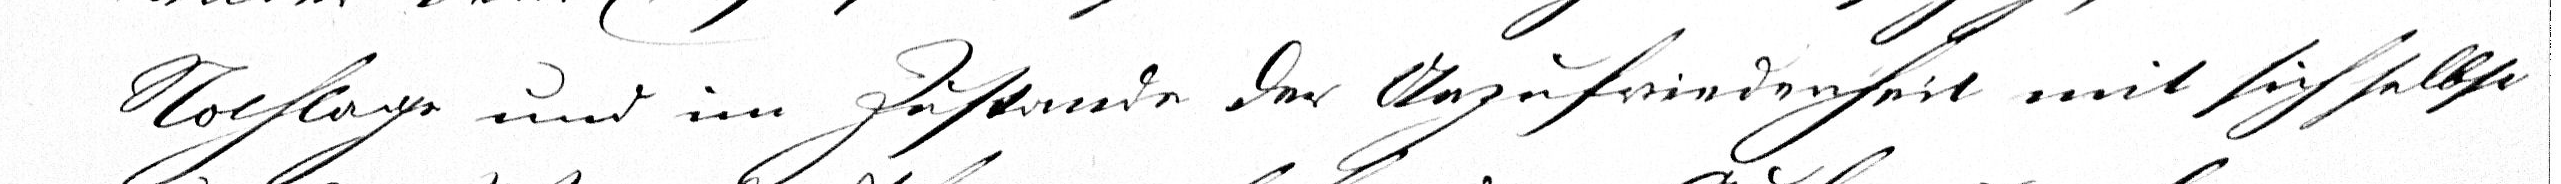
Nochlage und im Zustande der Unzufriedenheit mit sich selbst
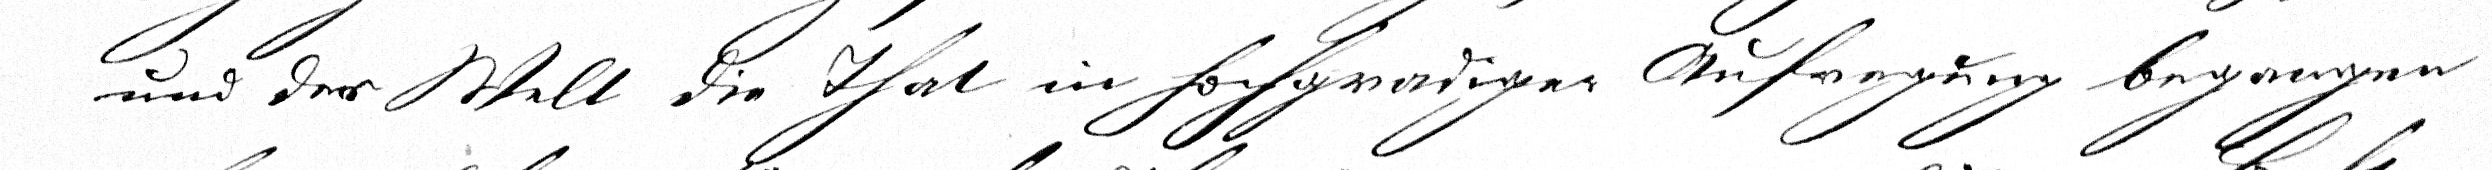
und der Welt die That in hochgradiger Aufregung begangen
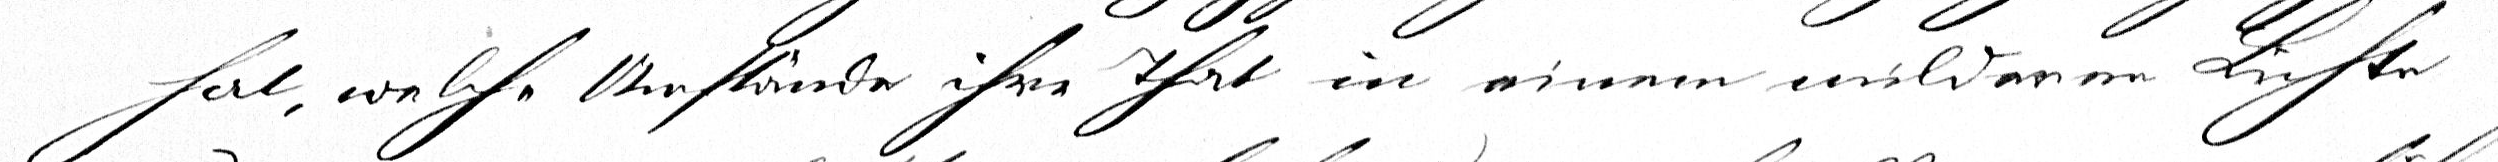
hat, welche Umstände ihre That in einem wilderer Lichte
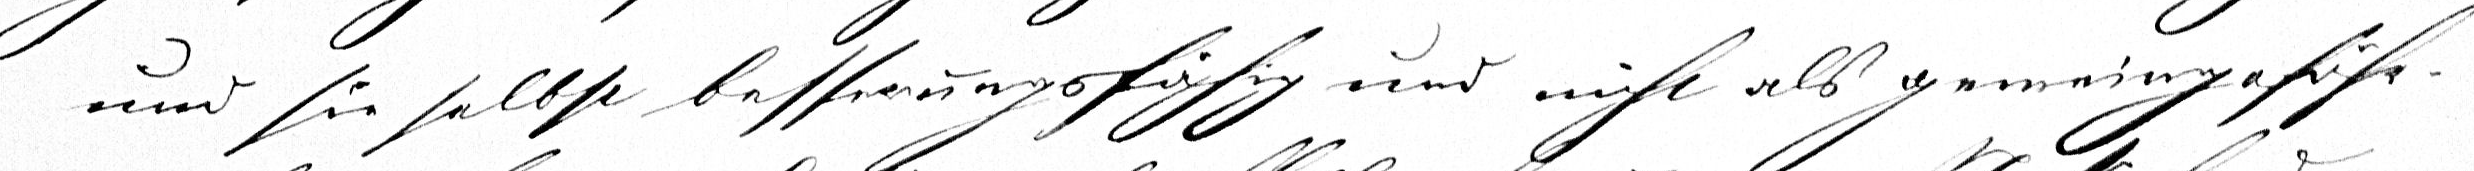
und sie selbst besserungsfähig und nicht als gemeingefähr¬
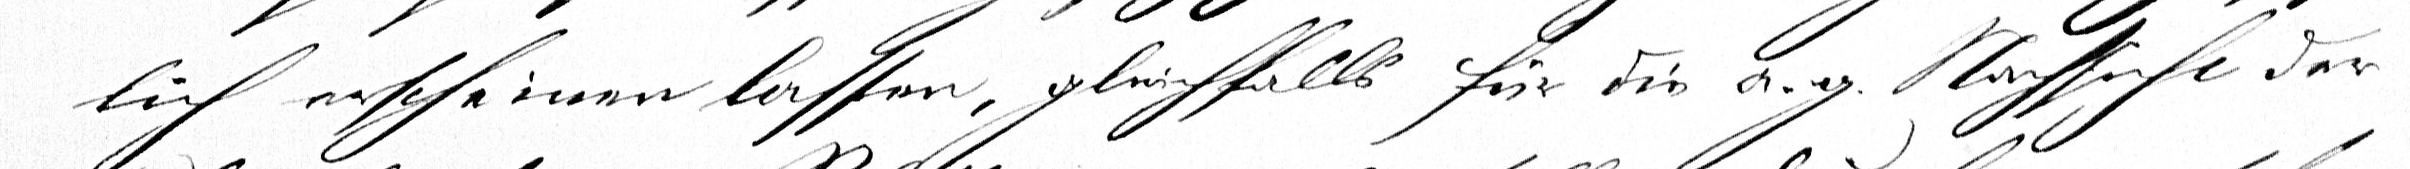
lich erscheinen lassen, gleichfalls für die a. g. Nachsaht der
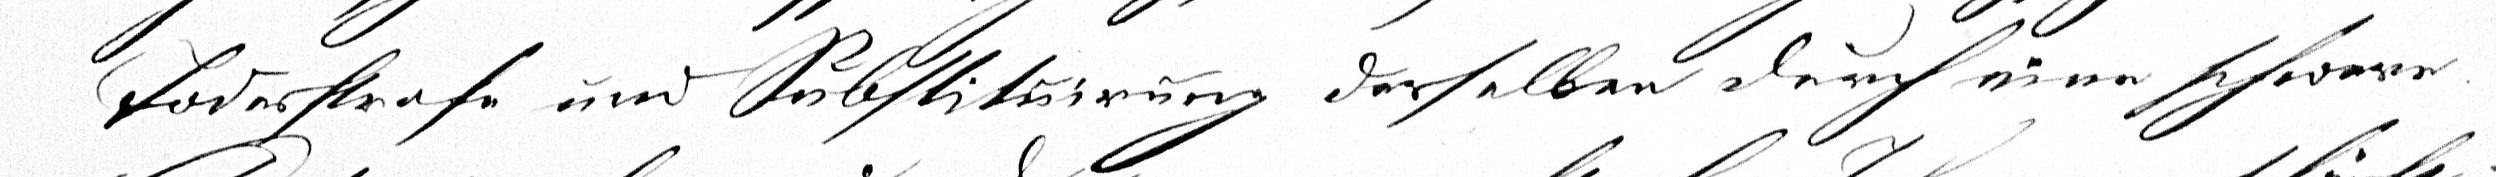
Todesstrafe und Substituirung derselben durch eine schwere
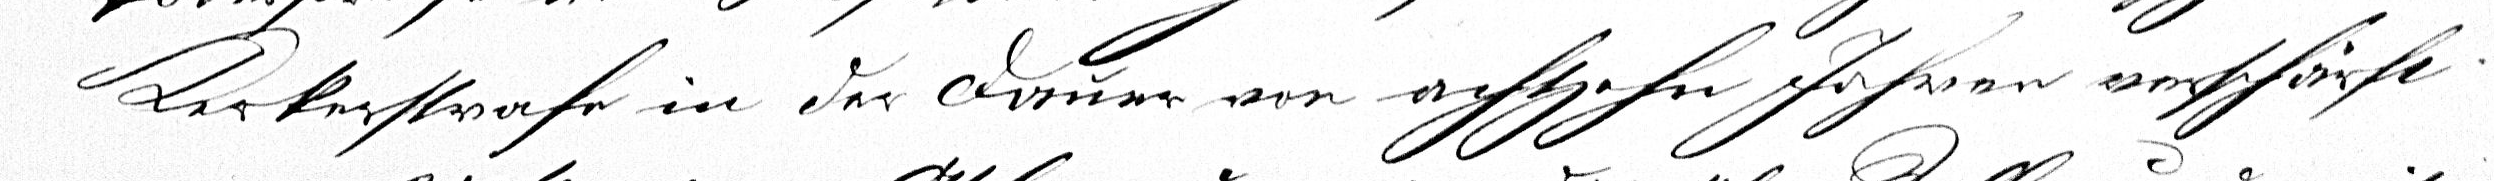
Kerkerstrafe in der Dauer von achtzehn Jahren verschärft
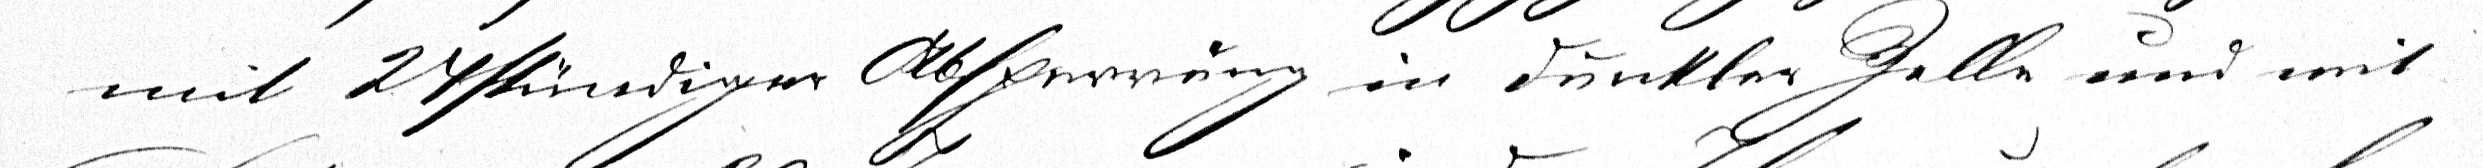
mit 24 stündiger Absperrung in dunkler Zelle und mit
